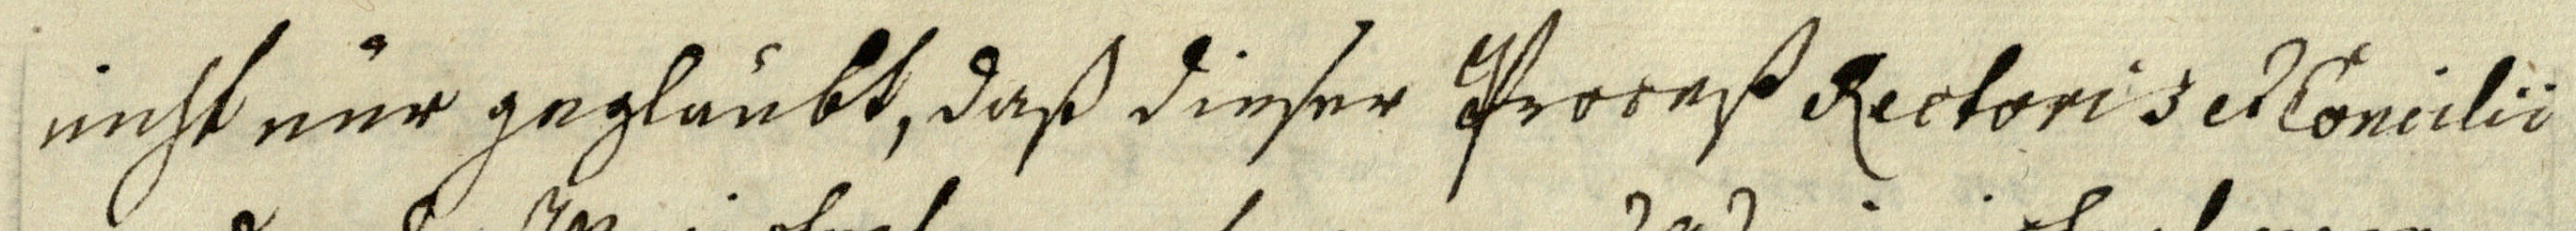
nicht nur geglaubt, daß dieser Proceß Rectoris et Concilii
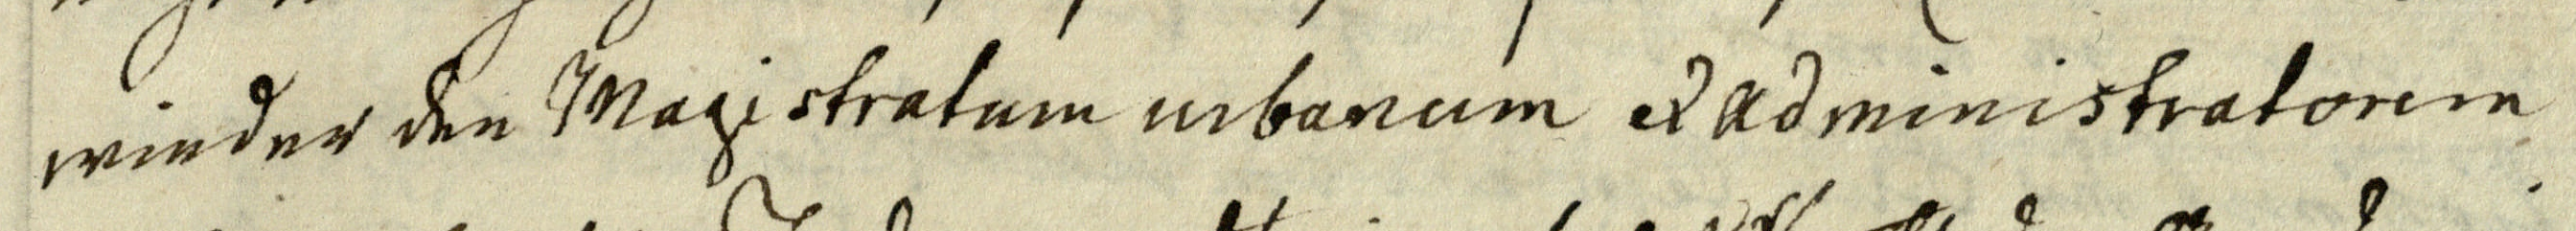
wieder den Magistratum urbarum et Administratorem
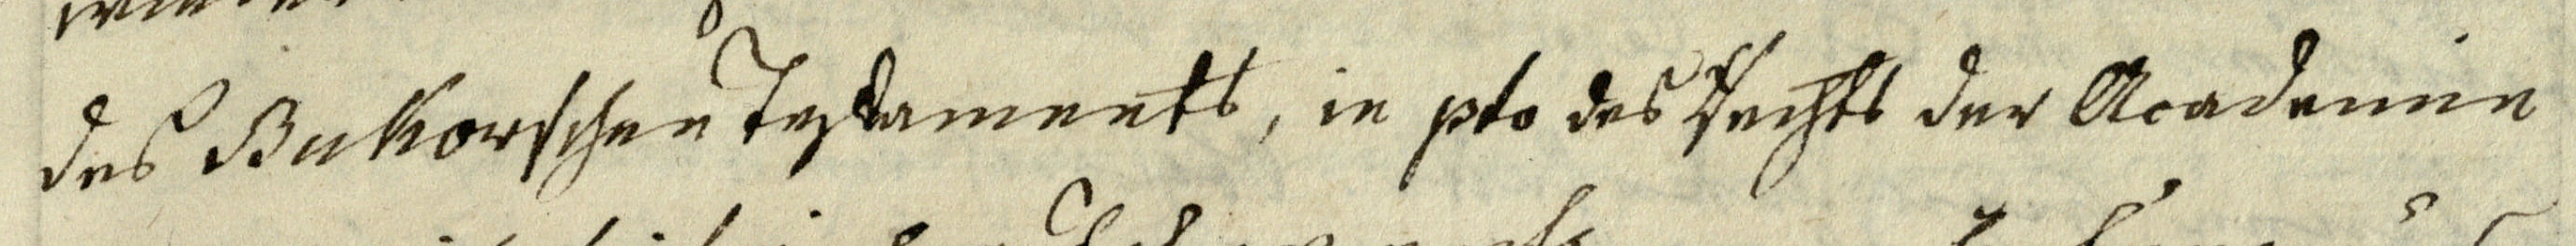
des BukowschenTestaments, in pto des Rechts der Academie
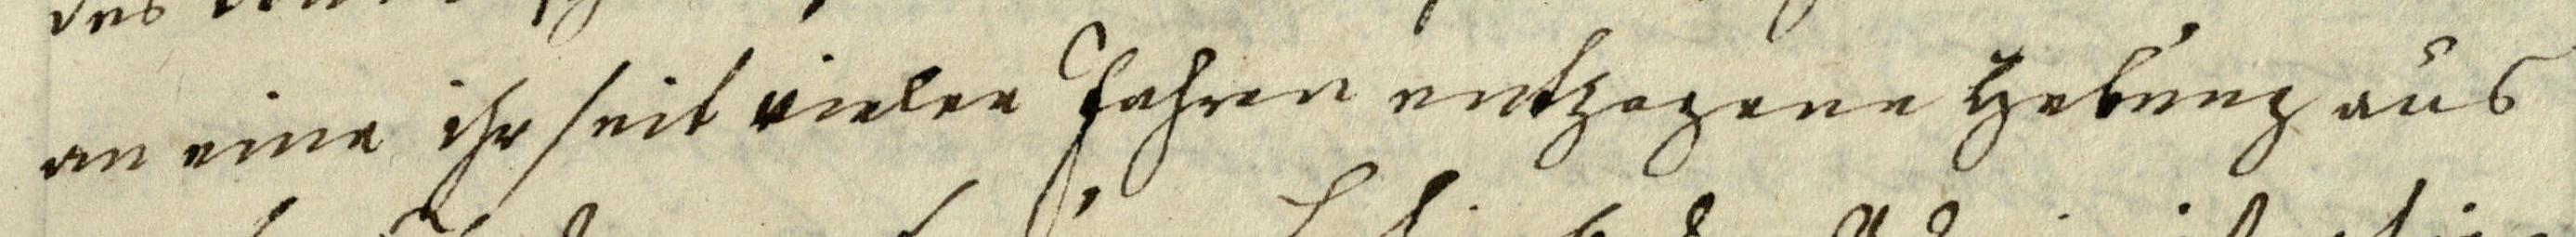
an eine ihr seit vielen Jahren entzogene Hebung aus
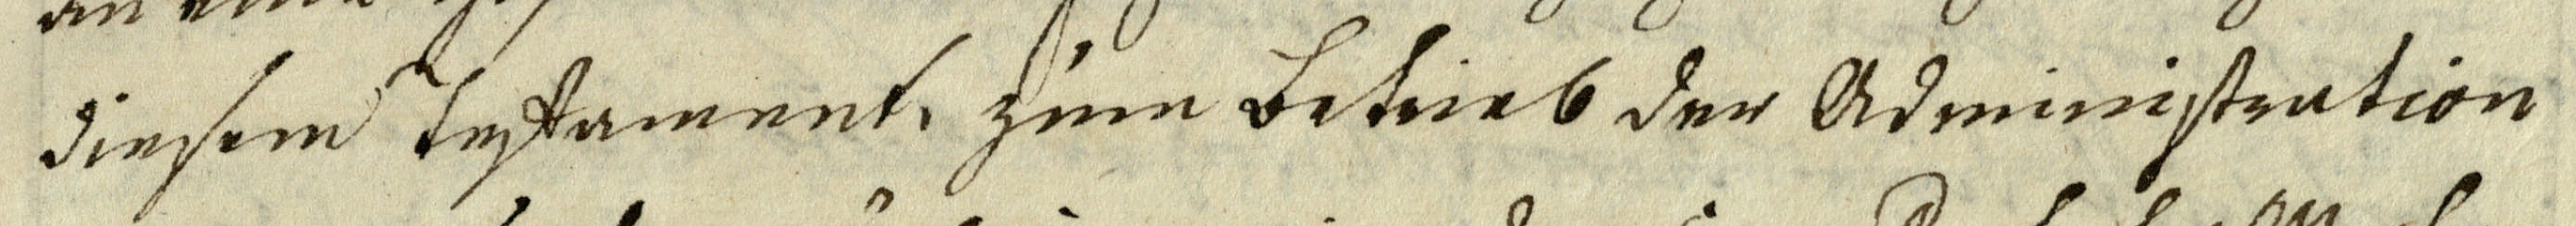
diesem Testament, zum Betrieb der Administration
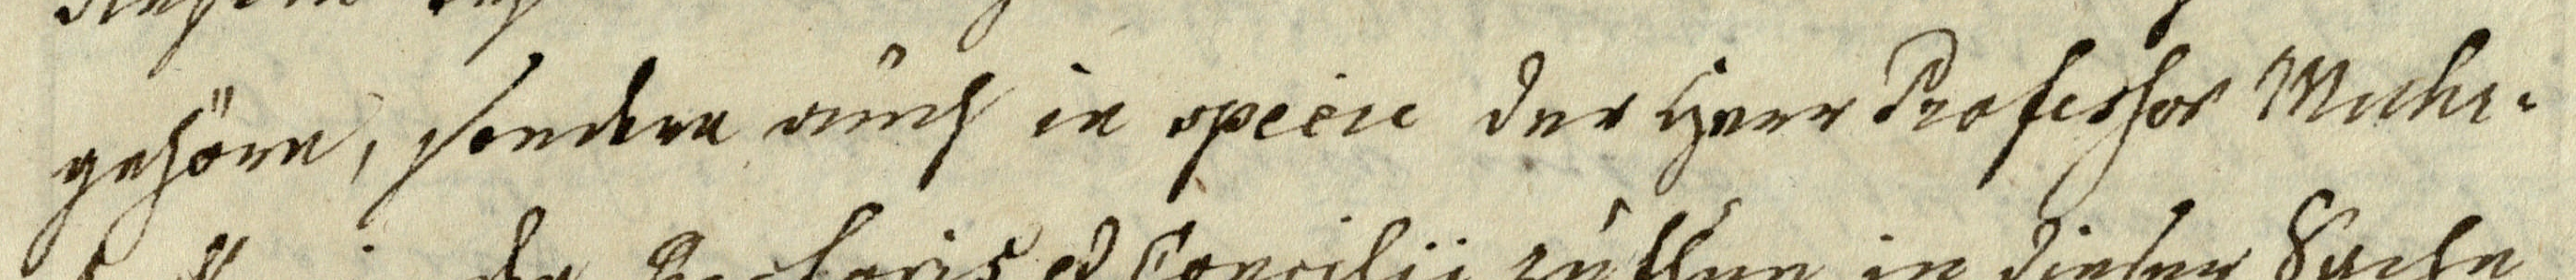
gehöre, sondern auch in specie der Herr Professor Muhr¬
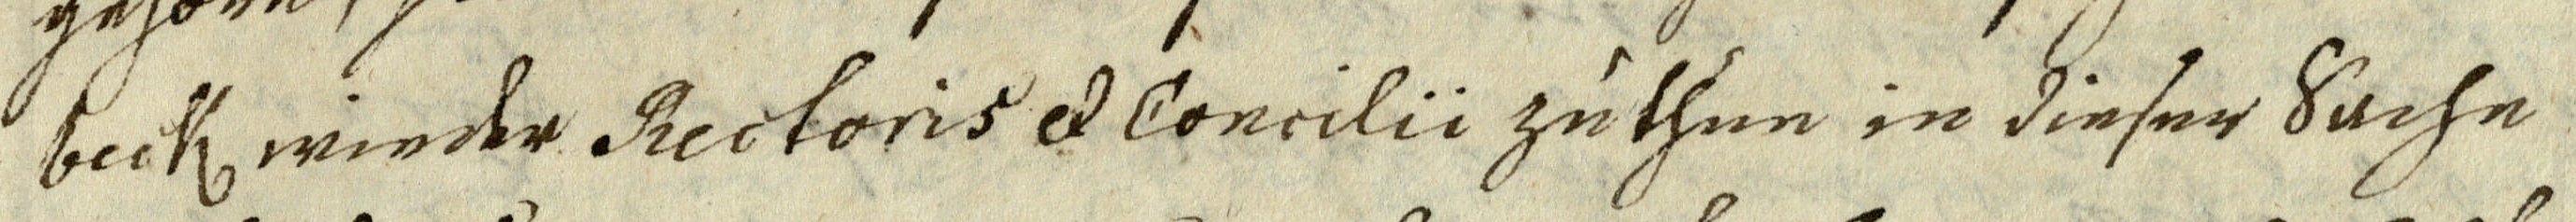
beck wieder Rectoris et Concilii zuthun in dieser Sache
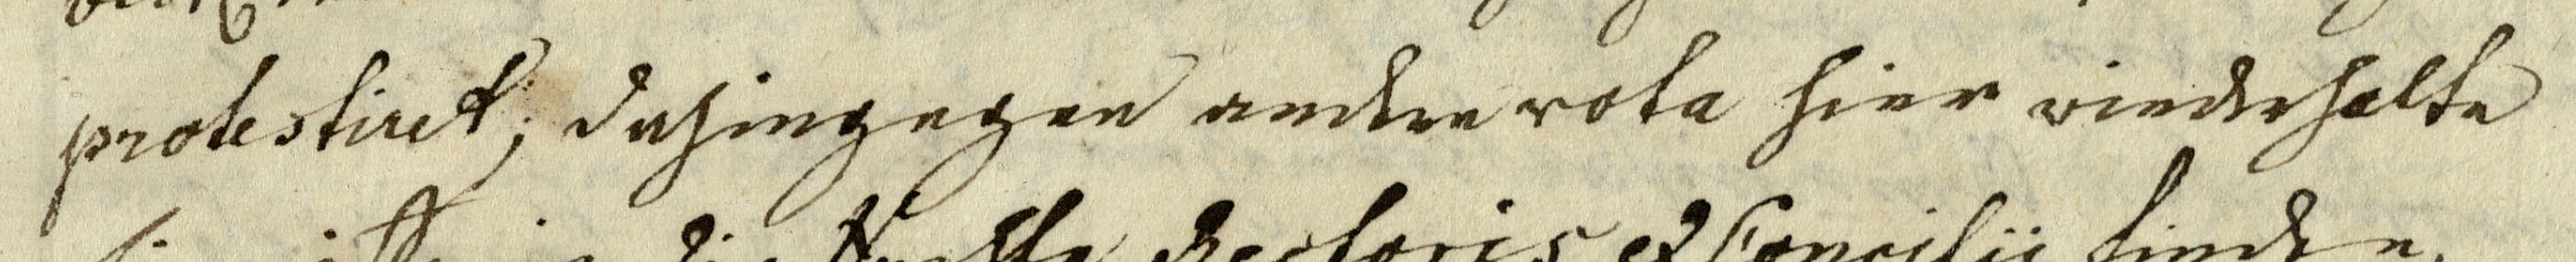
protestiret; dahingegen andere vota hier wiederholte
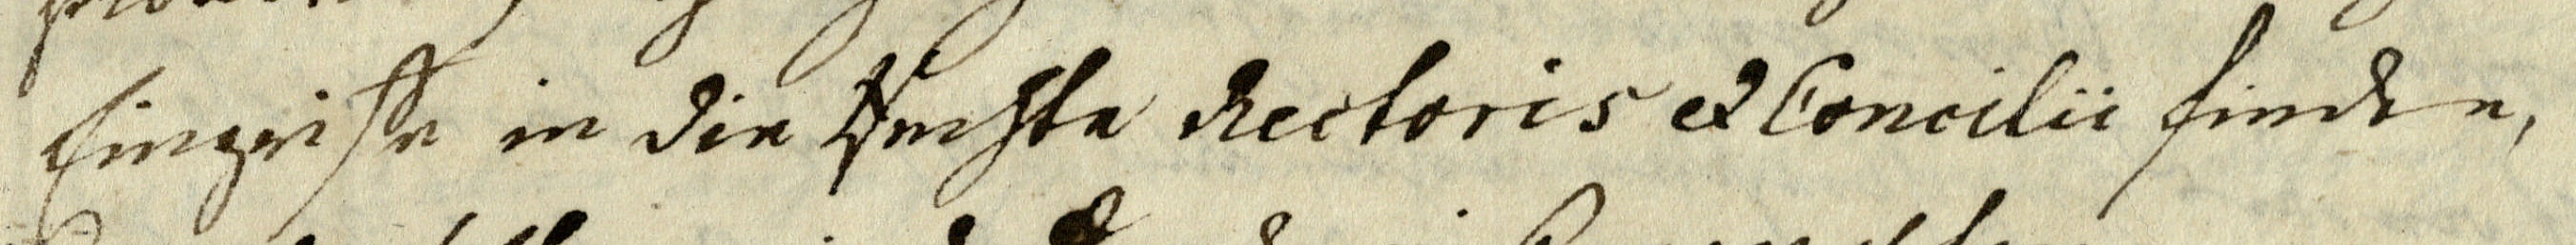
Eingriffe in die Rechte Rectoris et Concilii finden,
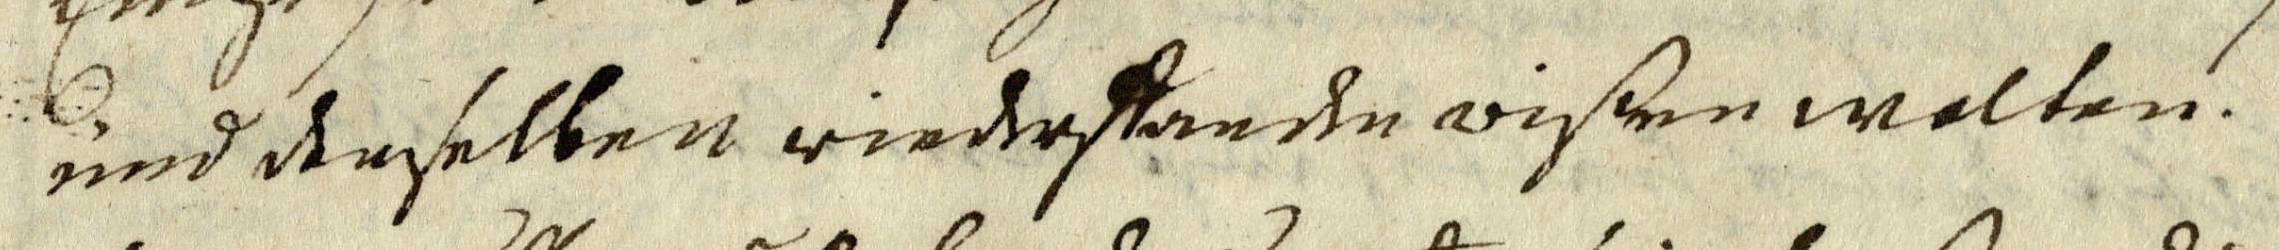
und denselben wiederstanden wißen wolten.
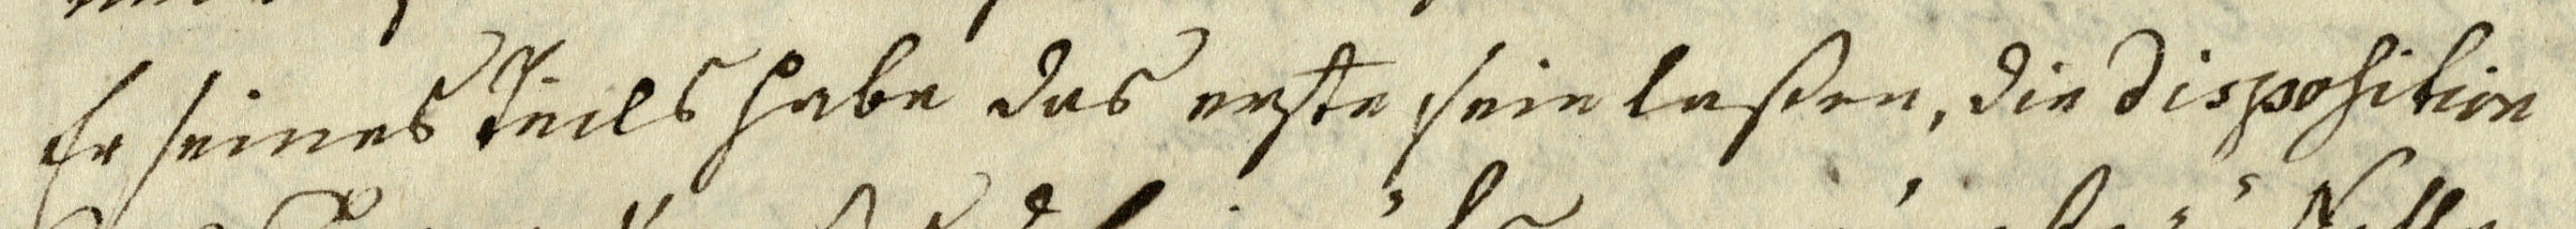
Er seines Teils habe das erste sein laßen, die disposition
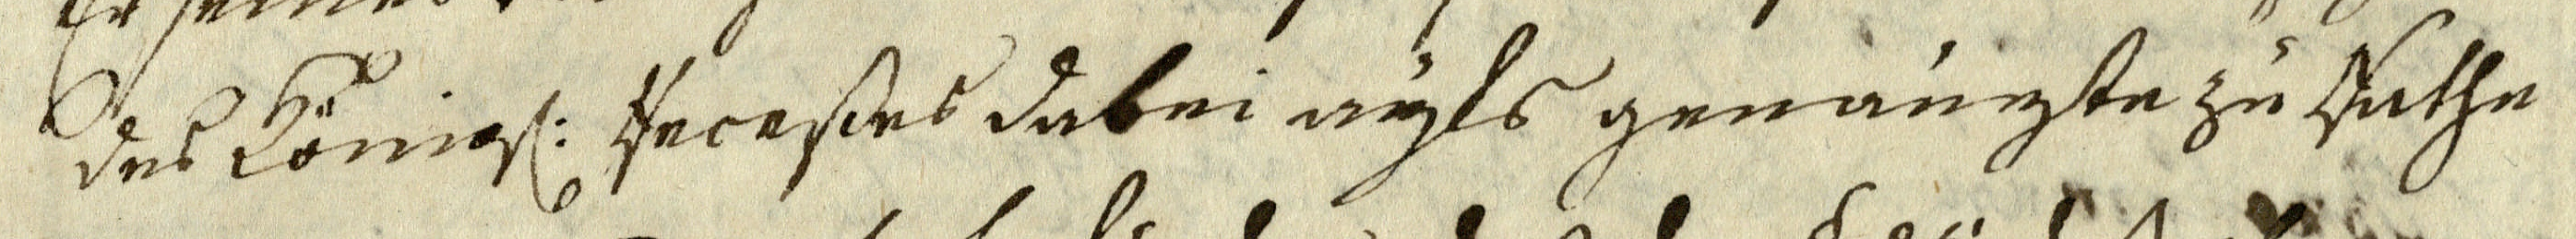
des Königl. Receßes dabei aufs genaueste zu Rathe
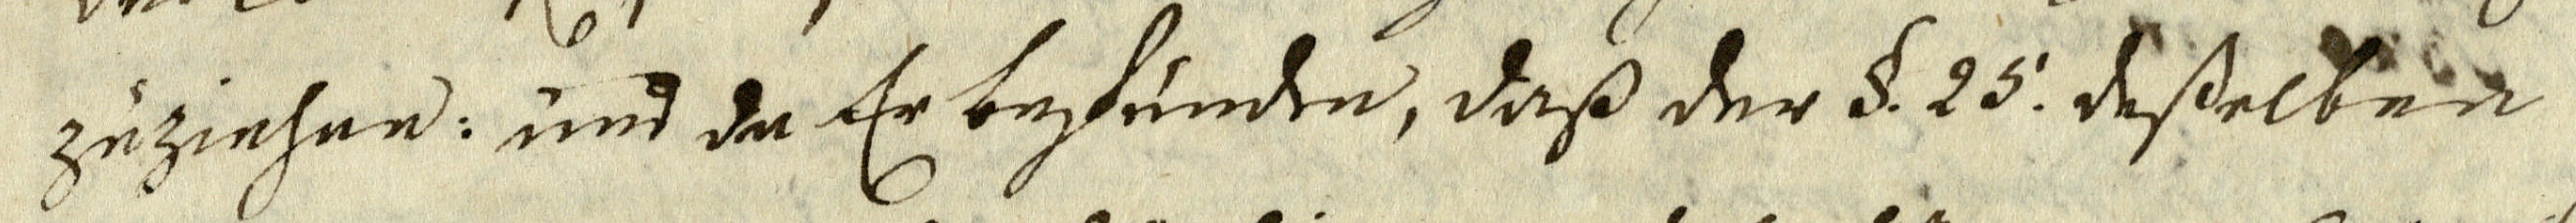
zuziehen, und da Er befunden, daß der § 25. deßelben
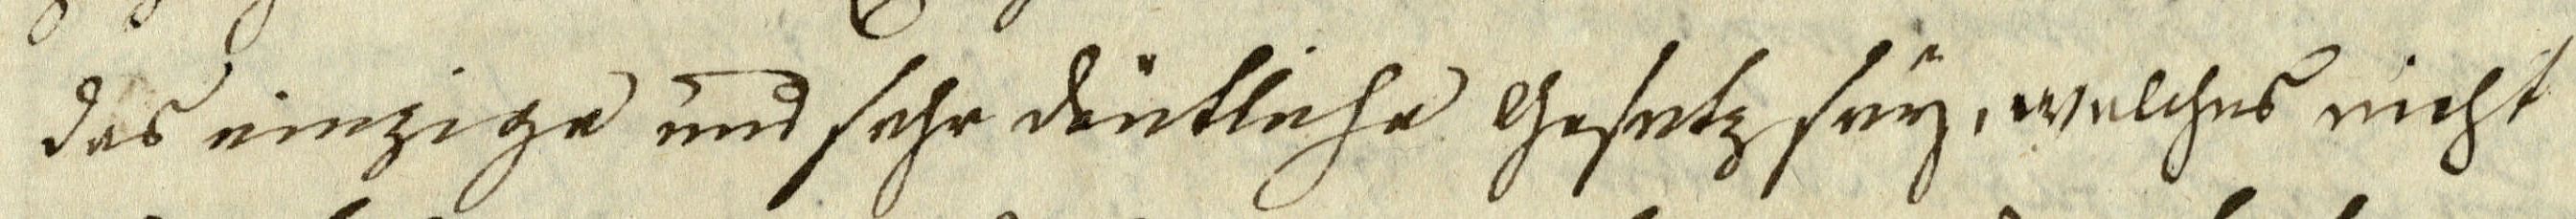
das einzige und sehr deutliche Gesetz seÿ, welches nicht
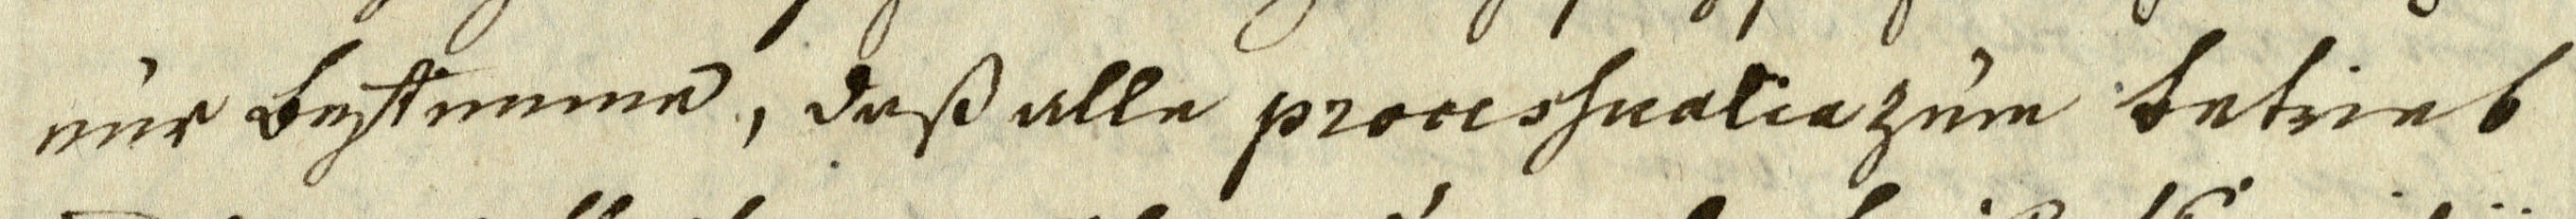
nur bestimme, daß alle processualia zum Betrieb
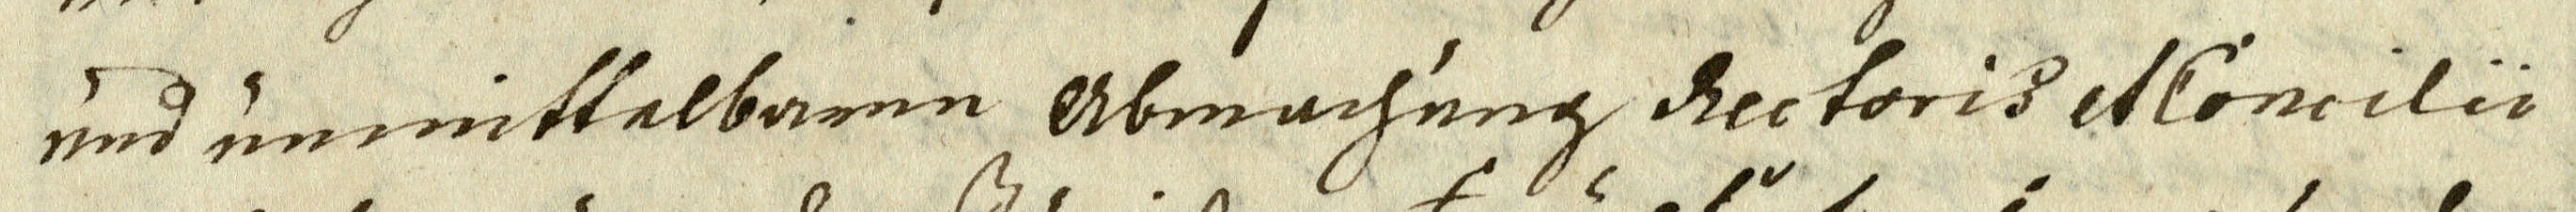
und unmittelbaren Abmachung Rectoris et Concilii
